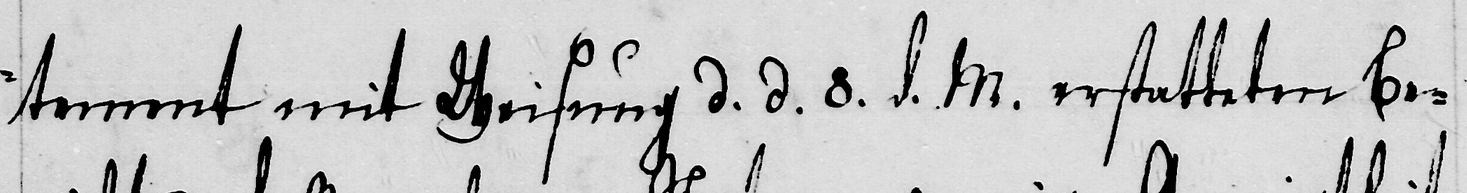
tement mit Weisung d. d. 8. d. M. erstatteten Be¬
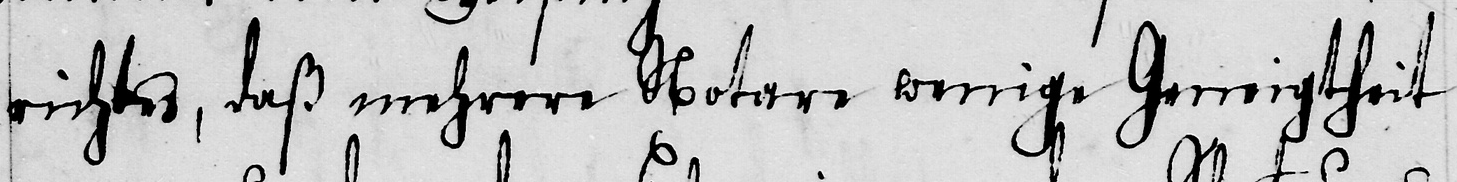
richtes, daß mehrere Notare wenige Geneigtheit
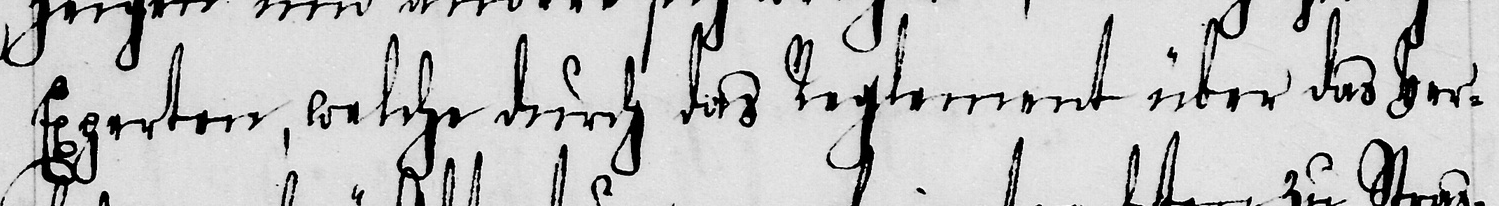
xperten, welche durch das Reglement über das Ver¬
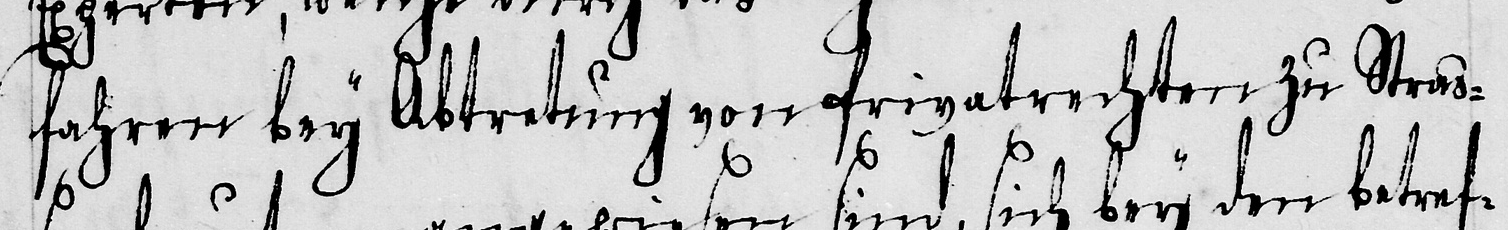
fahren bey Abtretung von Privatrechten zu Straß¬
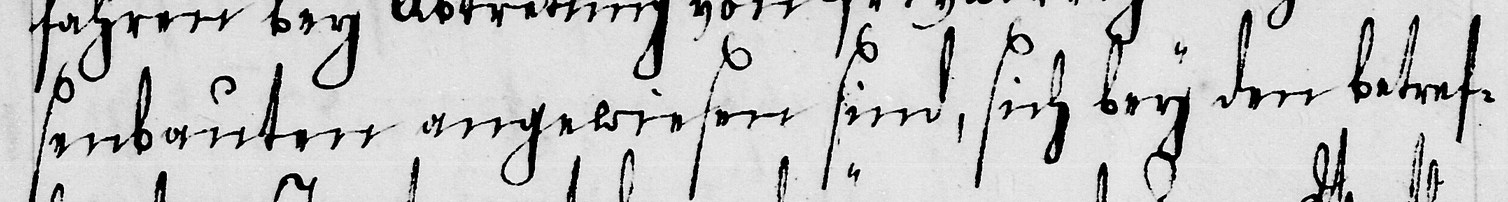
enbauten angewiesen sind, sich bey den betref¬
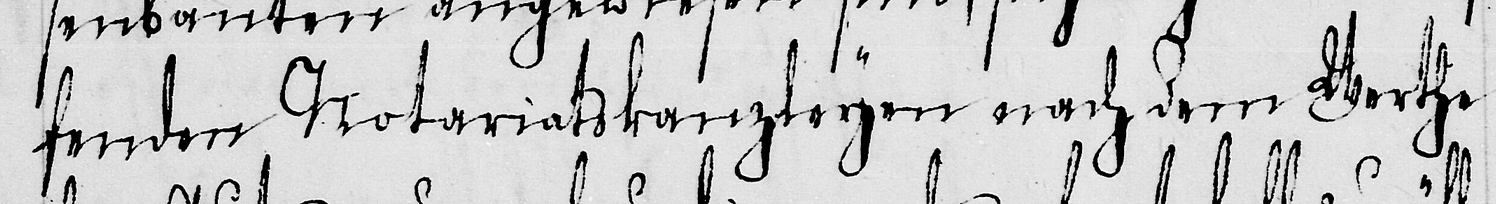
fenden Notariatskanzleyen nach dem Werthe
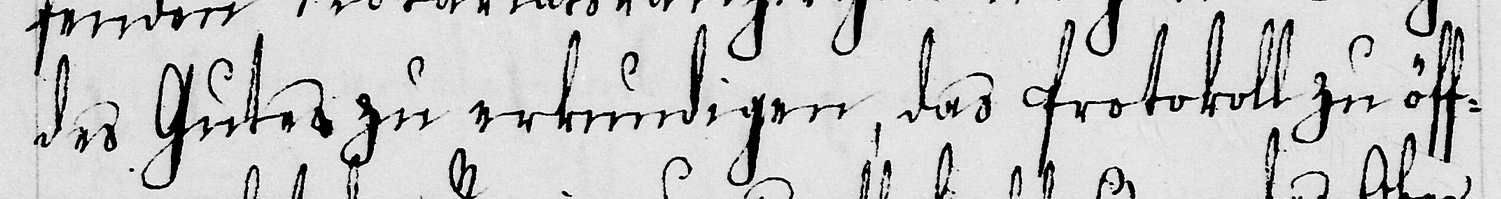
des Gutes zu erkundigen, das Protokoll zu öf¬
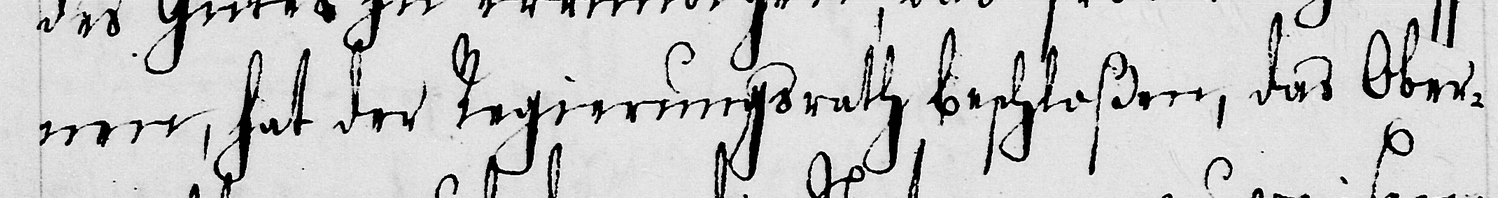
fnen, hat der Regierungsrath beschloßen, das Ober¬
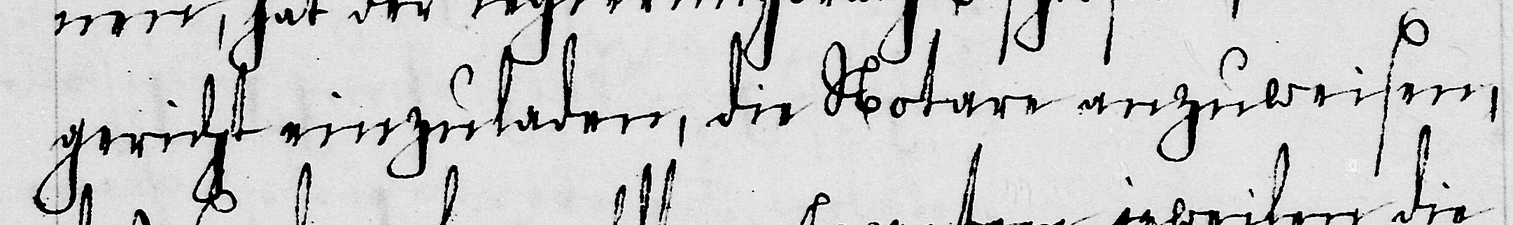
gericht einzuladen, die Notare anzuweisen,
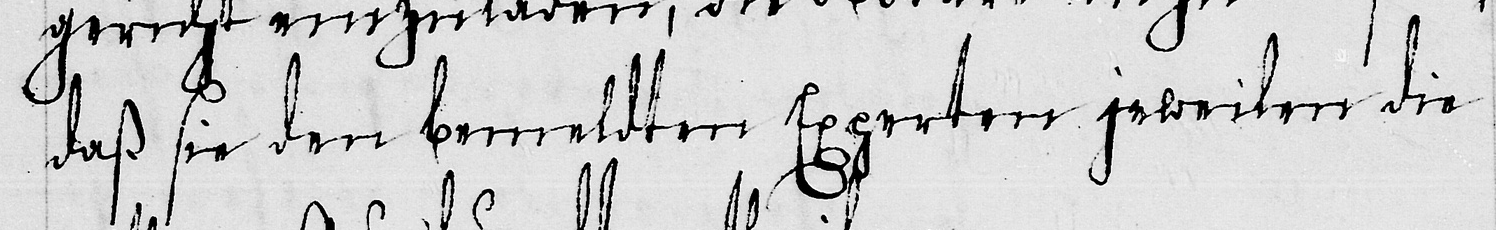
daß sie den bemeldten Experten jeweilen die
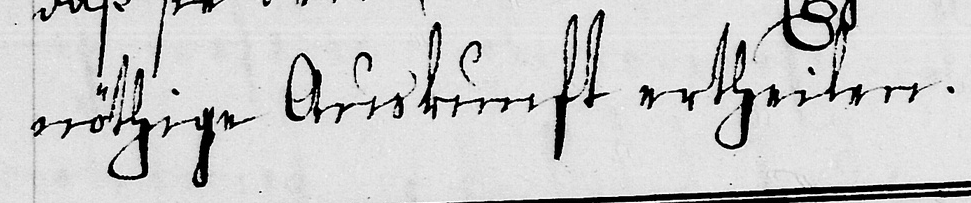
nöthige Auskunft ertheilen.
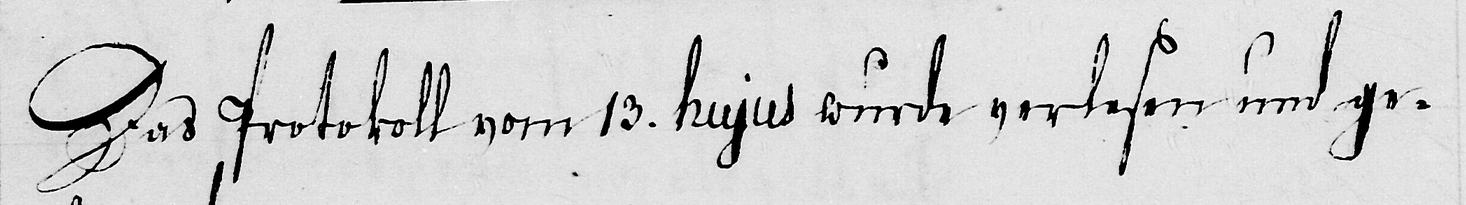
Das Protokoll vom 13. hujus wurde verlesen und ge¬
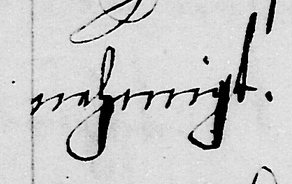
nehmigt.
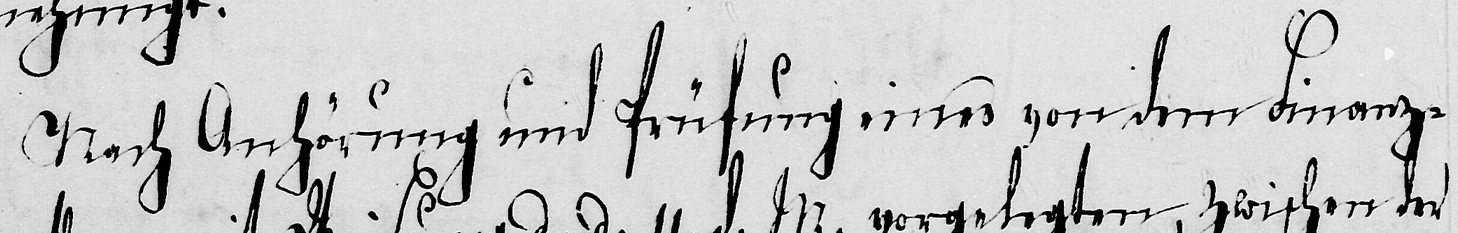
Nach Anhörung und Prüfung eines von dem Finanz¬
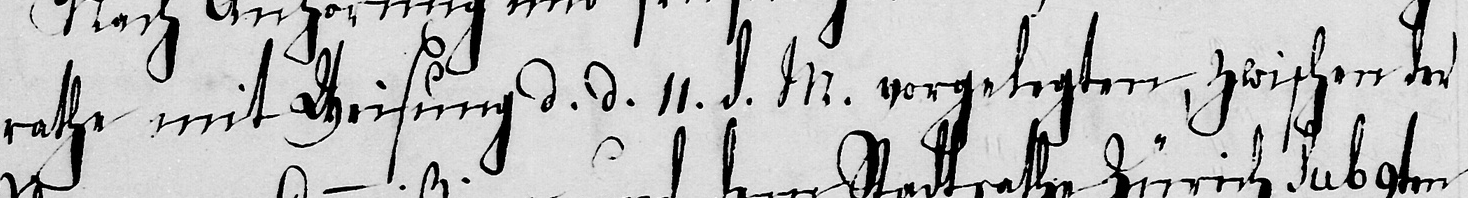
rathe mit Weisung d.d. 11. d. M. vorgelegten, zwischen der
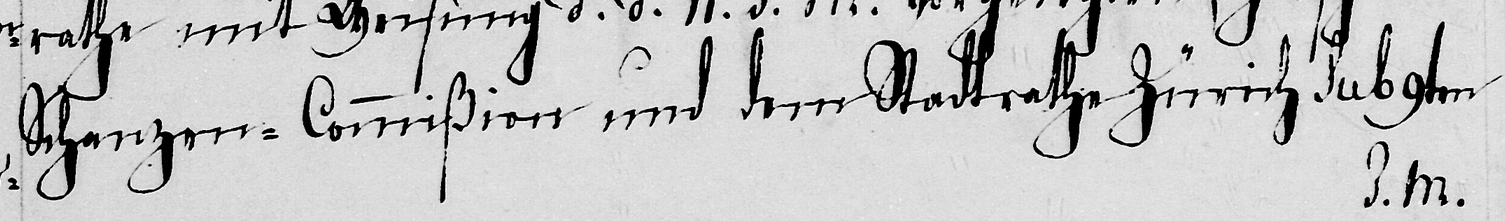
Schanzen-Commißion und dem Stadtrathe Zürich sub 9ten
